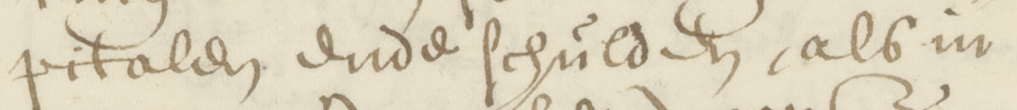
pitalen ende schulden, als in
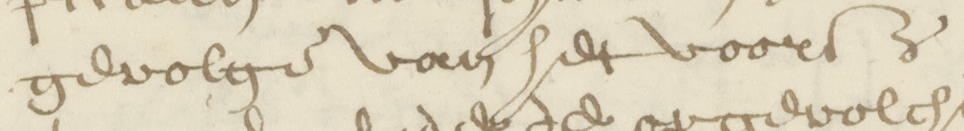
gevolge van het voors
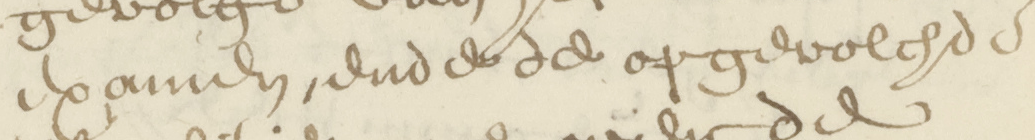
examen, ende de opgevolchde
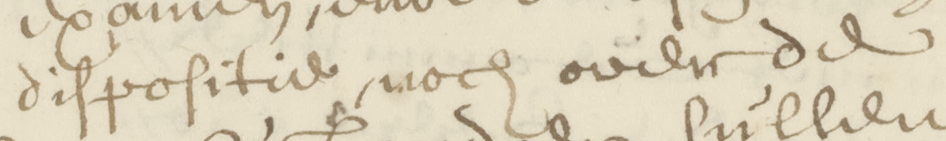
dispositie, noch over de
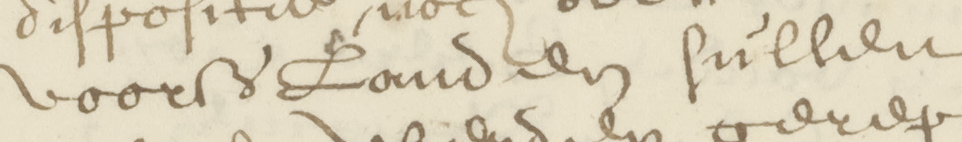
voors Landen sullen
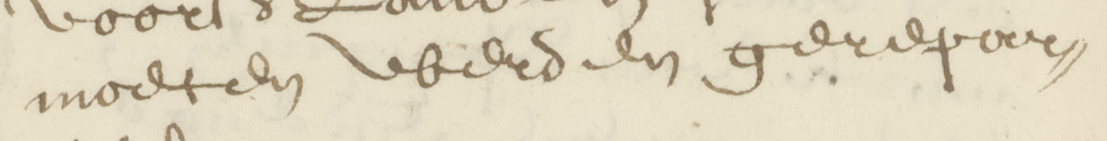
moeten werden gerepar,,
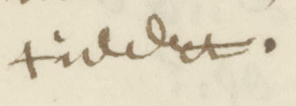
tieert.
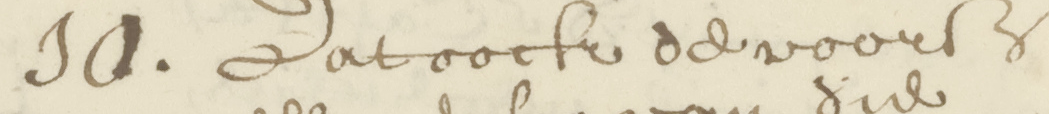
10. Dat oock de voors
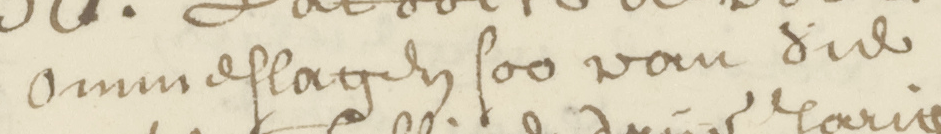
ommeslagen soo van die
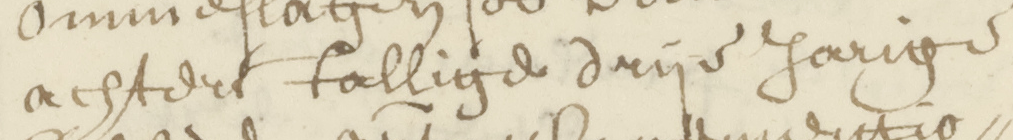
achterstallige drije Jarige
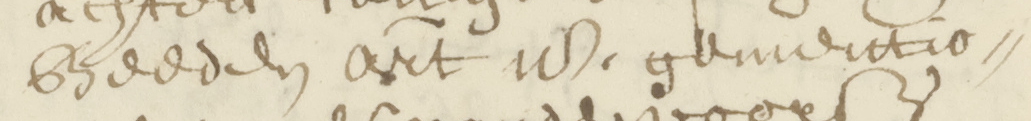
Beeden art 18 gementio„
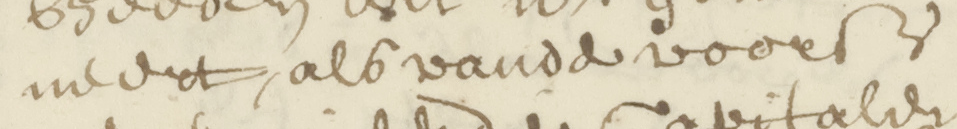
neert, als vande voors
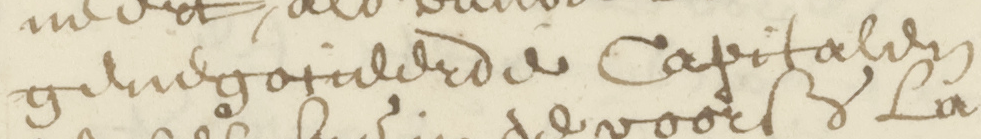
genegotieerde Capitalen
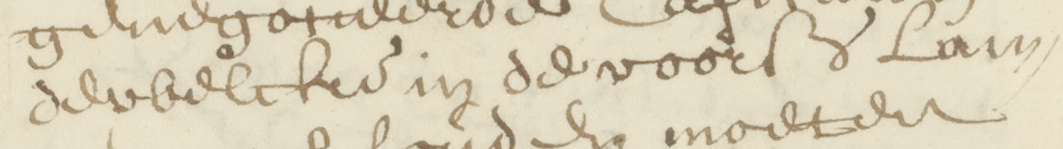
dewelcke in de voors Lan„
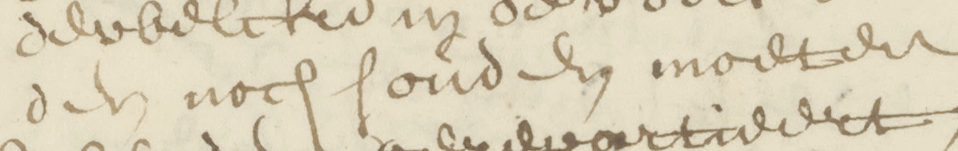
den noch souden moeten
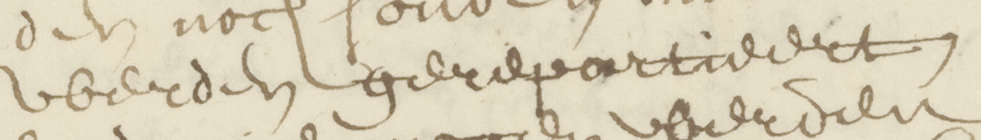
werden gerepartieert,
